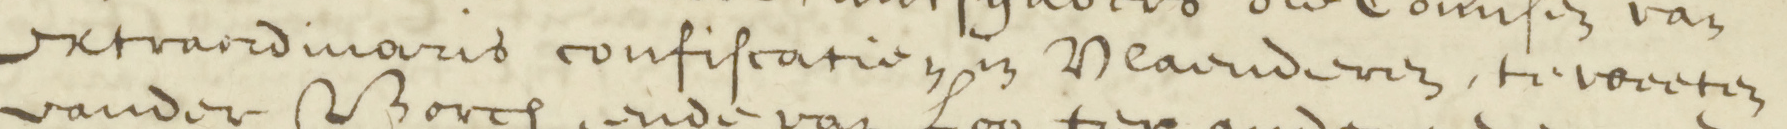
Extraordinaris confiscatien in Vlaenderen, te weeten
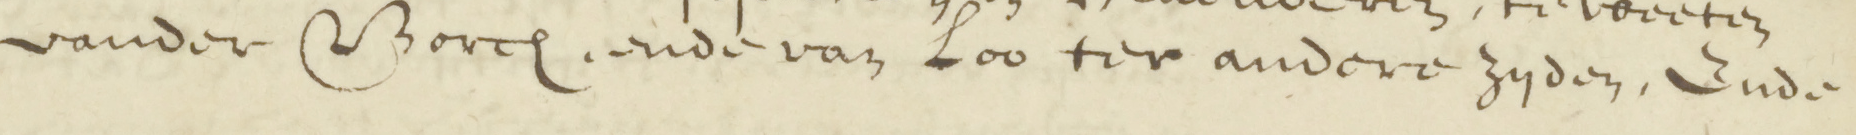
vander Borch, ende van Loo ter andere zyden, Ende
